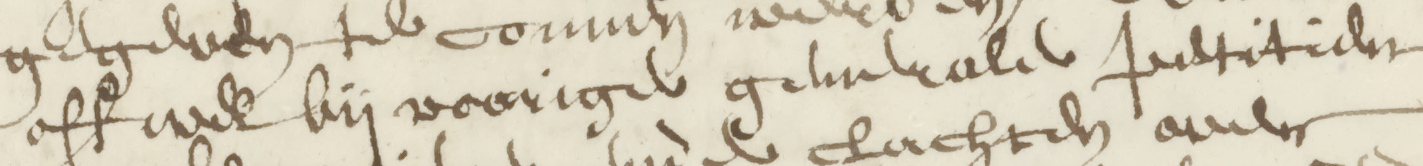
off wel bij voorige generale petitien
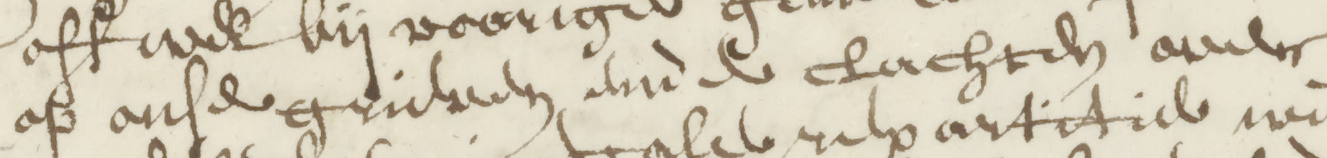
op onse grieven ende clachten over
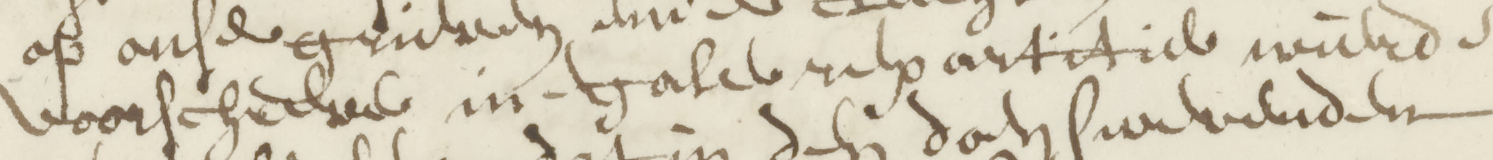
voorschreve inegale repartitie wierde
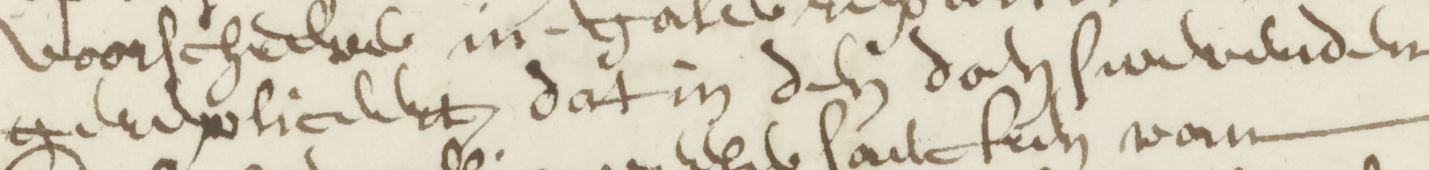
gerepliceert, dat in den doen swevenden
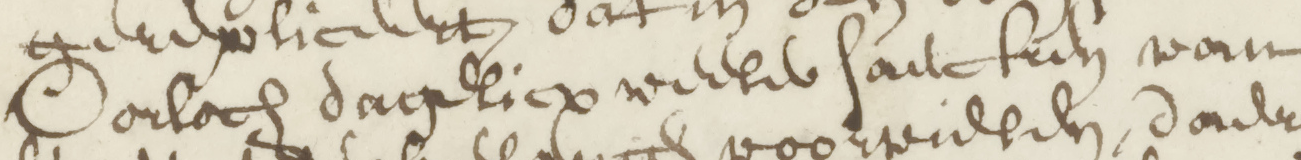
Oorloch dagelicx veele saecken van
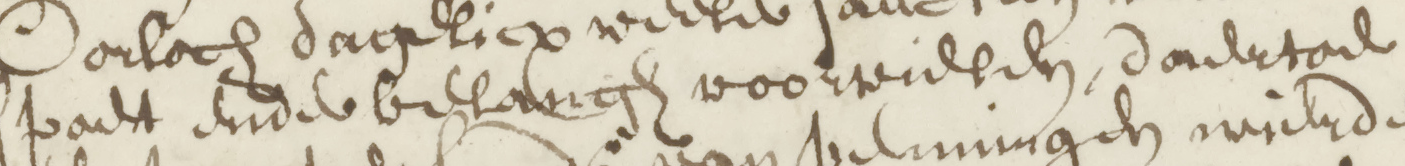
spoet ende belangh voorvielen, daertoe
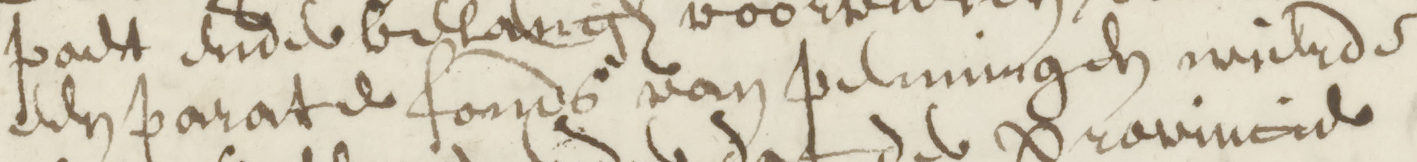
een parate fonds van penningen wierde
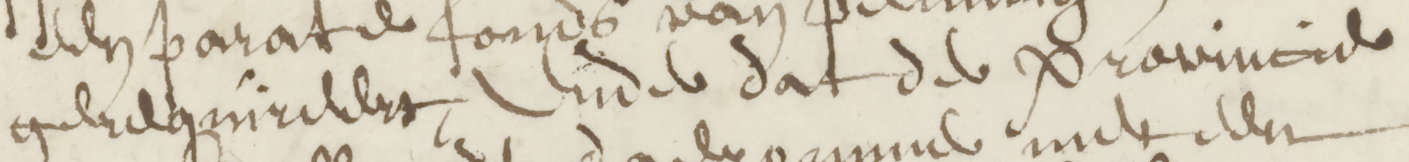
gereguireert, Ende dat de Provincie
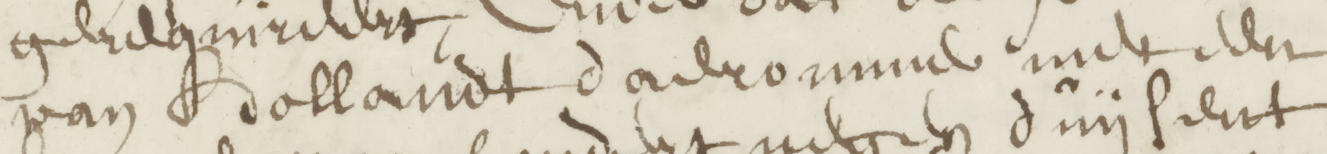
van Hollandt daeromme met een
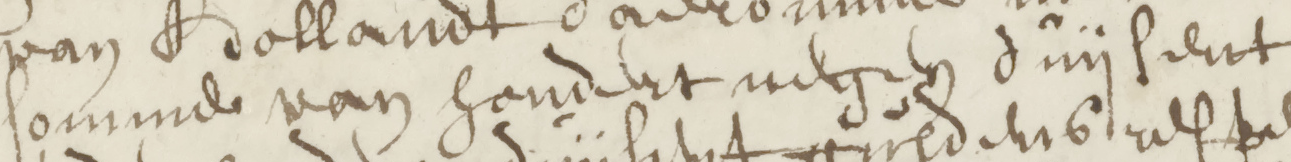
somme van hondert negen duijsent
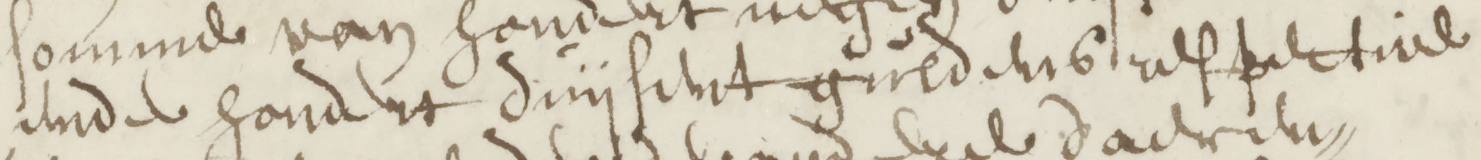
ende hondert duijsent guldens respective
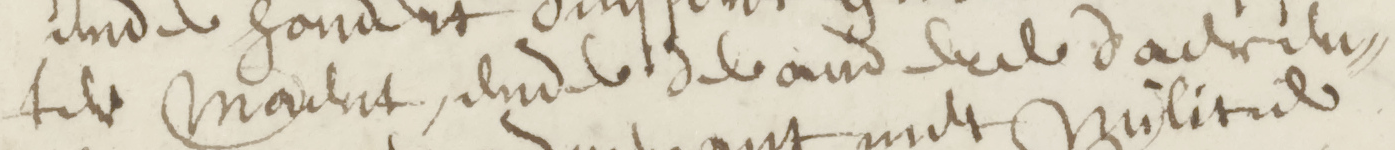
ter maent, ende de andere daeren„
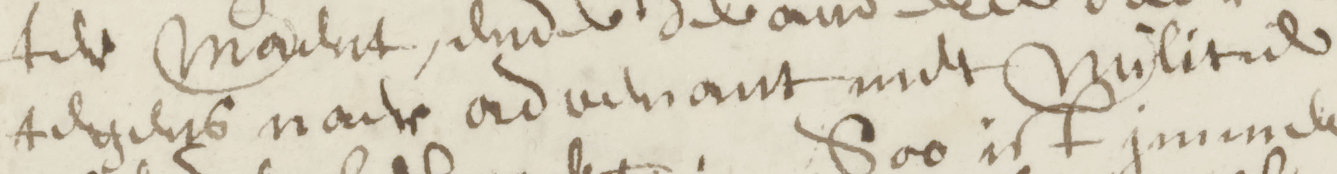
tegens naer advenant met Militie
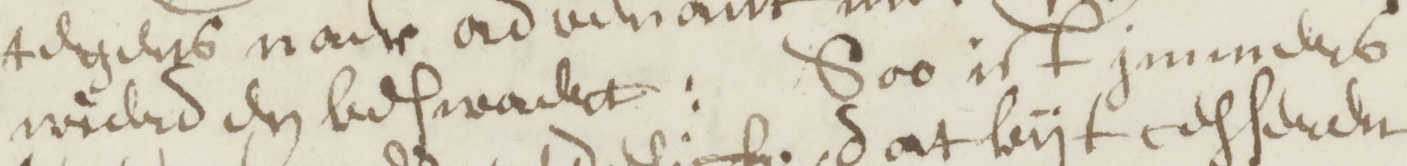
wierden beswaert: Soo ist immers
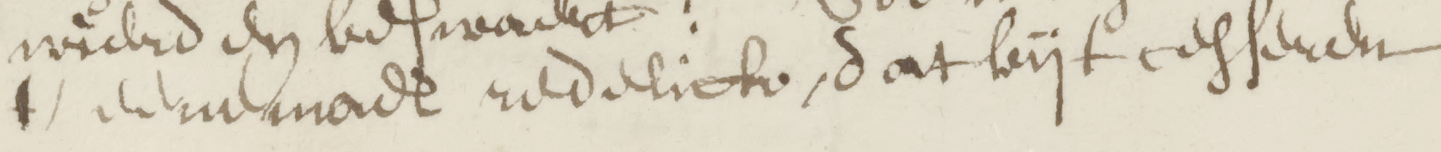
t'eenemael redelick, dat bij t cesseren
